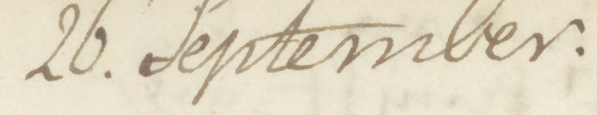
26. September.
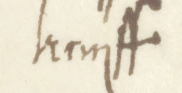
kruijff
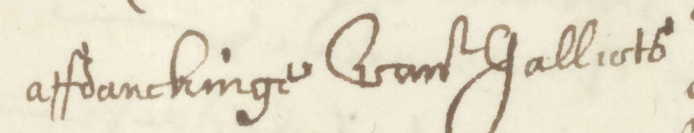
affdanckinge van Galliots
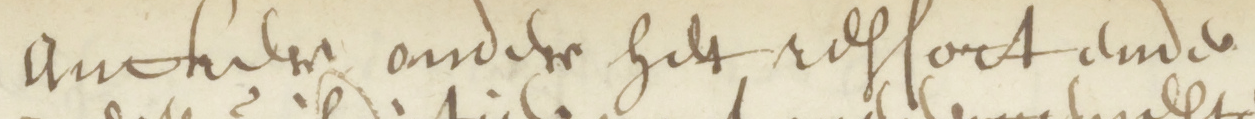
Ancker onder het ressort ende
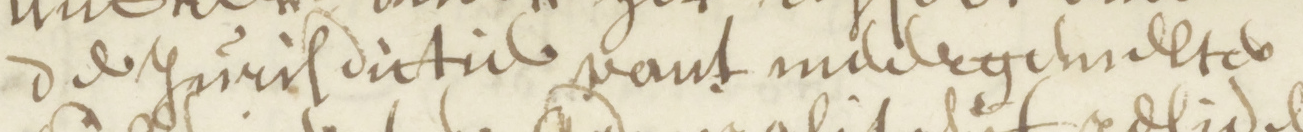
de Jurisdictie vant meergemelten
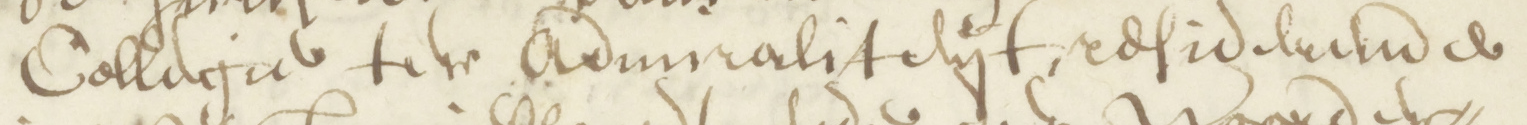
Collegie ter Admiraliteijt, residerende
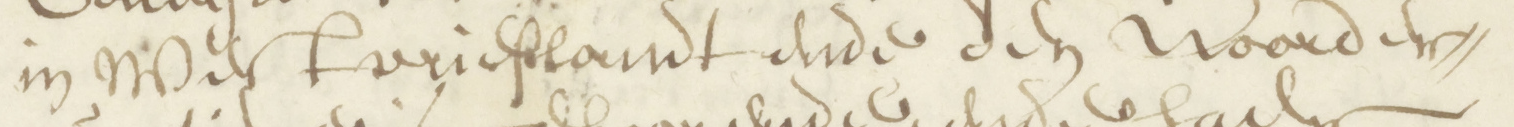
in Westvrieslandt ende den Noorder„
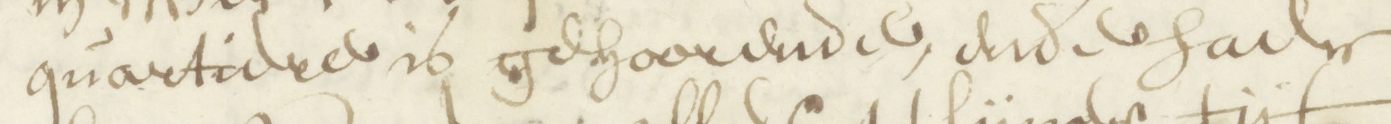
quartiere is gehoorende, ende haer
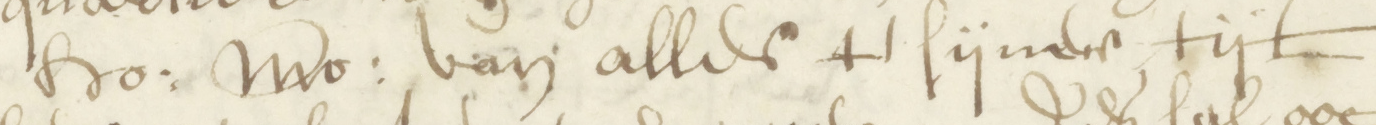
Ho:Mo: van alles t' sijner tijt
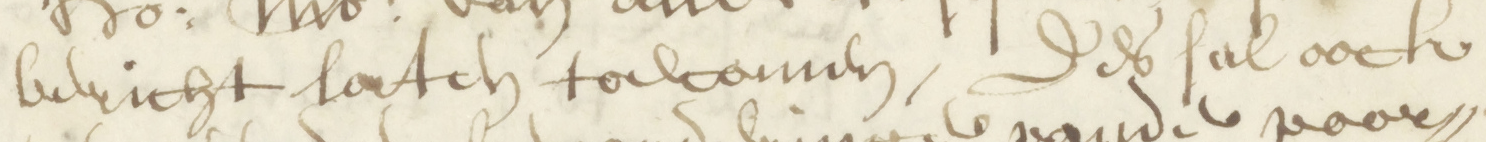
bericht laten toecomen. Des sal oock
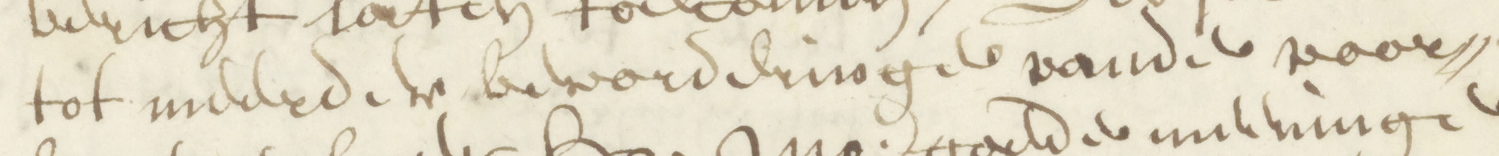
tot meerder bevordernoge vande voor,,
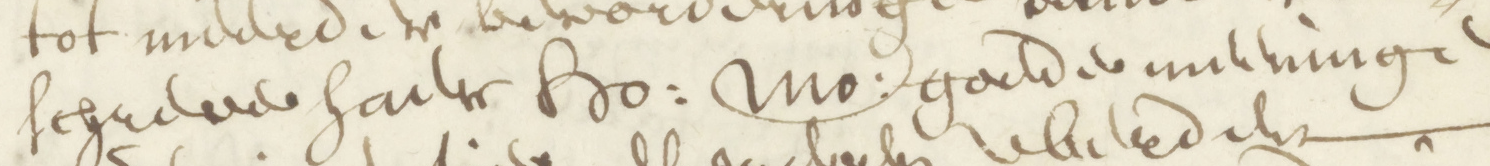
schreve haer Ho:Mo: goede meeninge
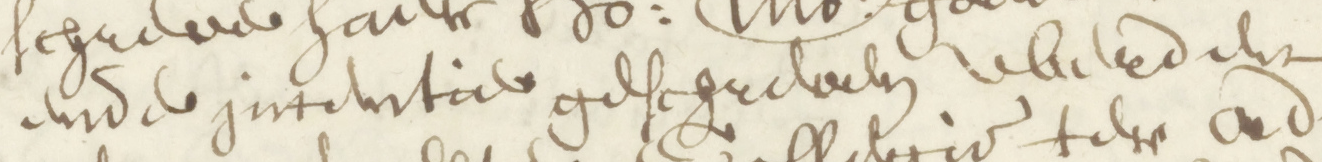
ende intentie geschreven werden
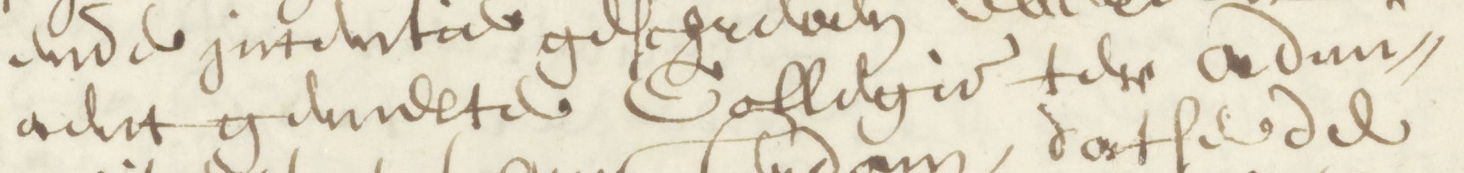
aent gemelte Collegie ter Admi,,
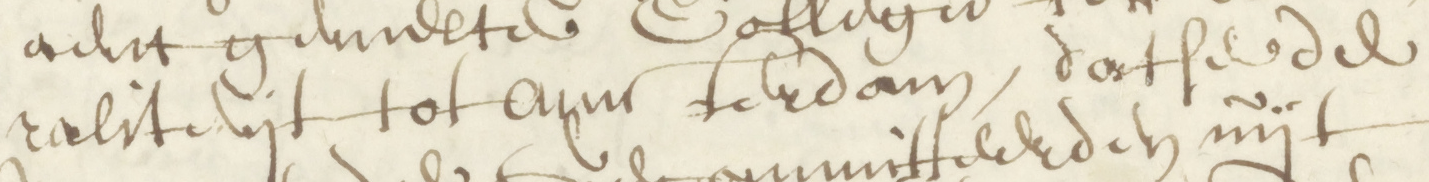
raliteijt tot Amsterdam, datse de
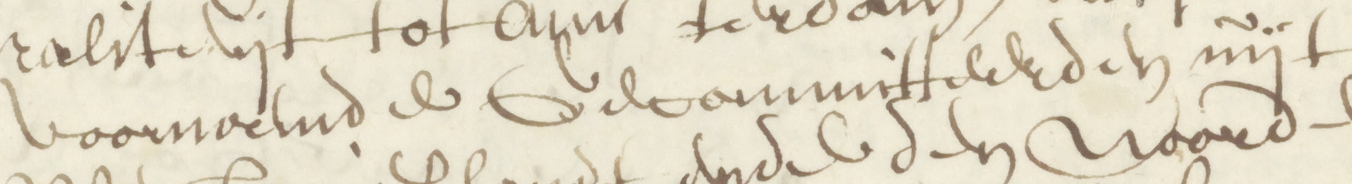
voornoemde Gecommitteerden uijt
